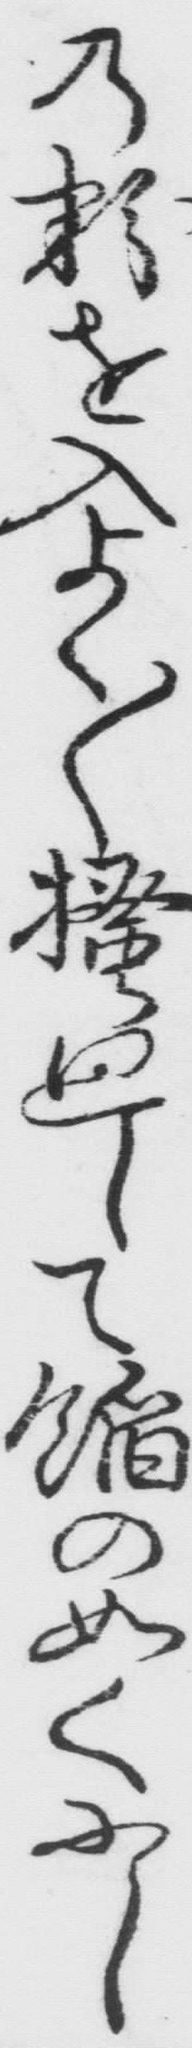の粉を入よく〳〵掻廻して餡の如くにし
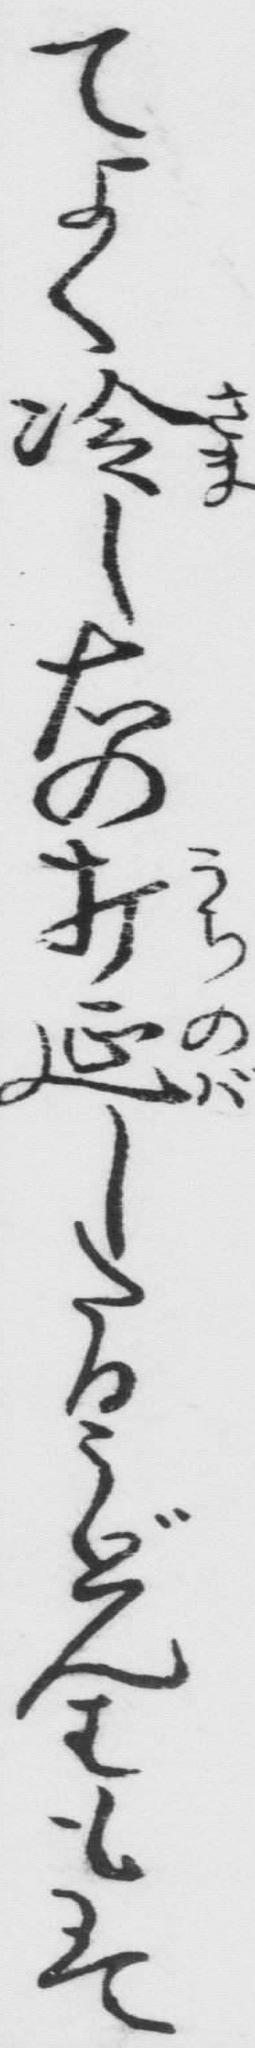てよく冷し右の打延したるうどんはもにて
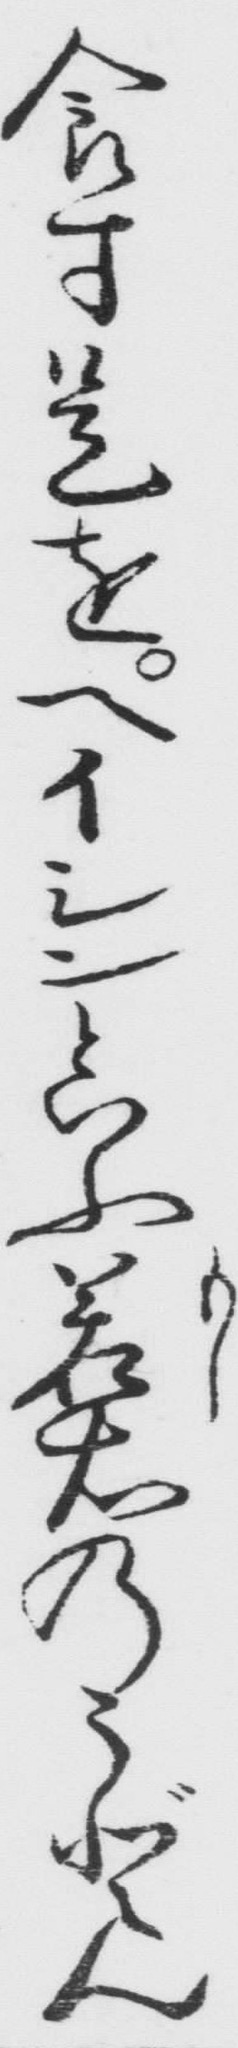食す是をペイシンといふ若右のうどん
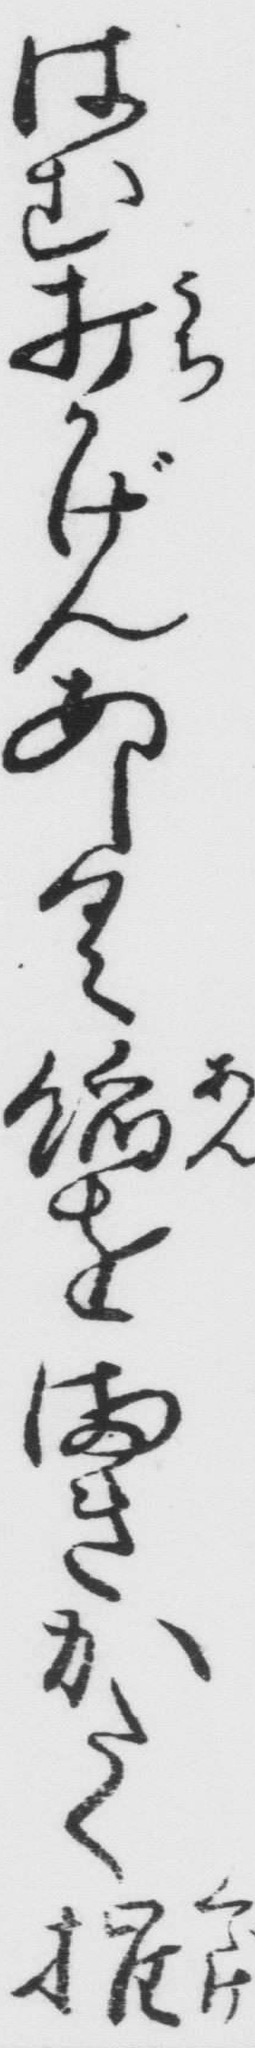はむ打かげんあしく餡をまきかたく摧
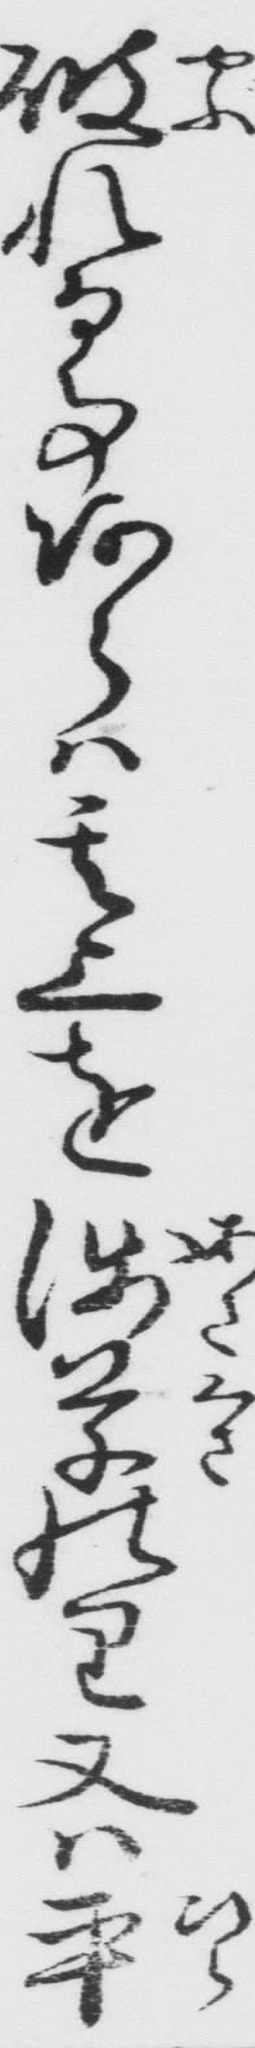破れる事あらは其上を浅草のり又は平
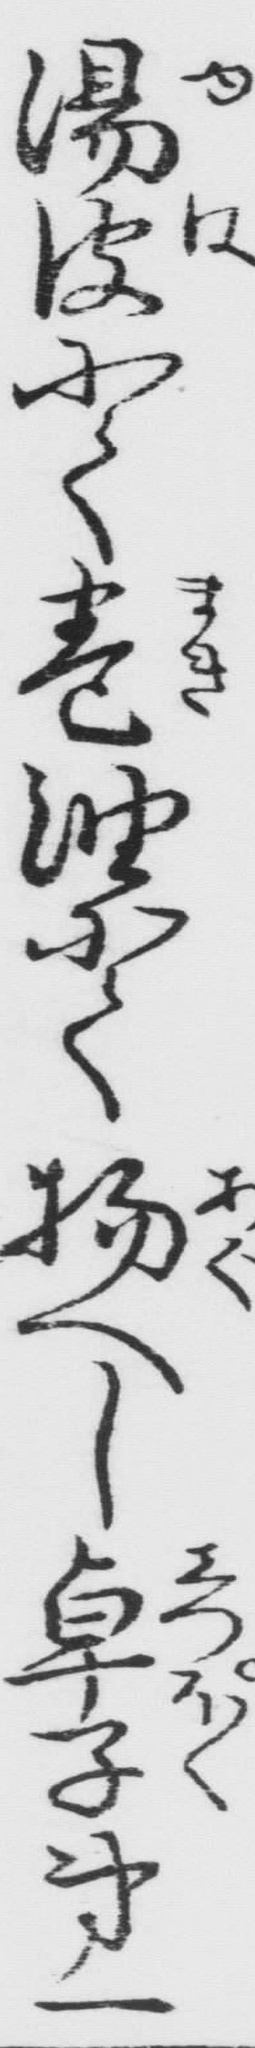湯皮にて巻油にて揚へし卓子第一
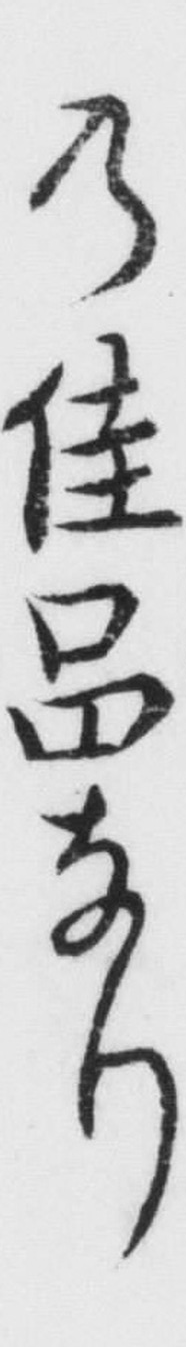の佳品なり
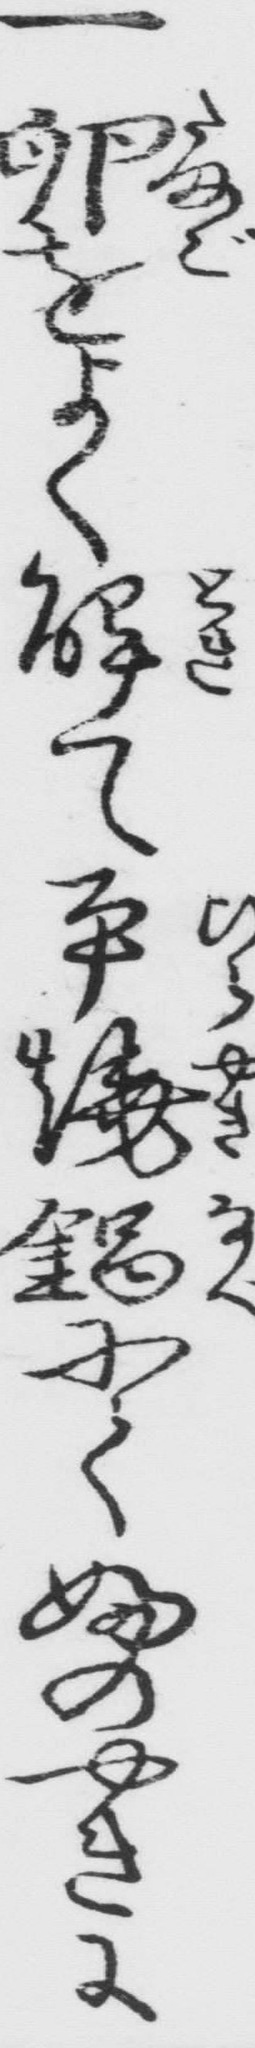一卵をよく解て平燒鍋にてふのやきに

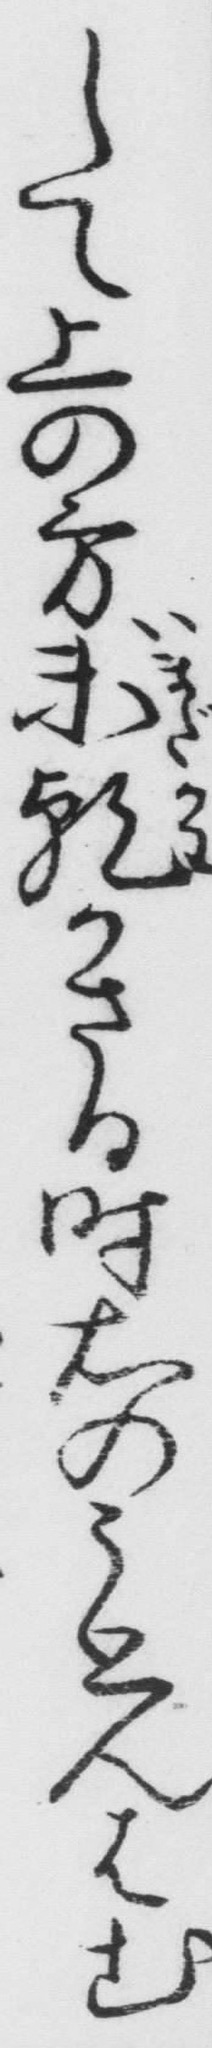して上の方未乾かさる時右のうとんはむ
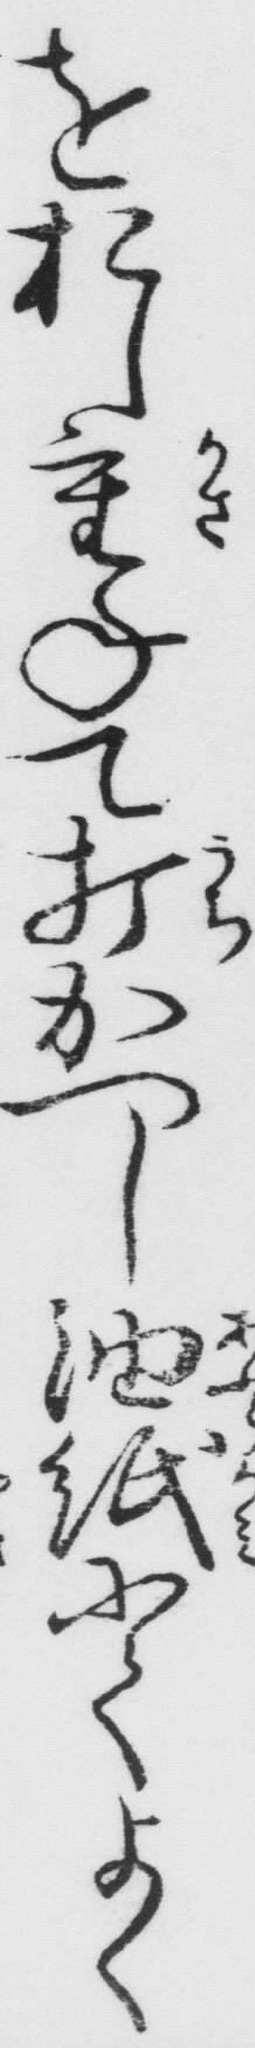をおし重ねて打かへし油紙にてよく
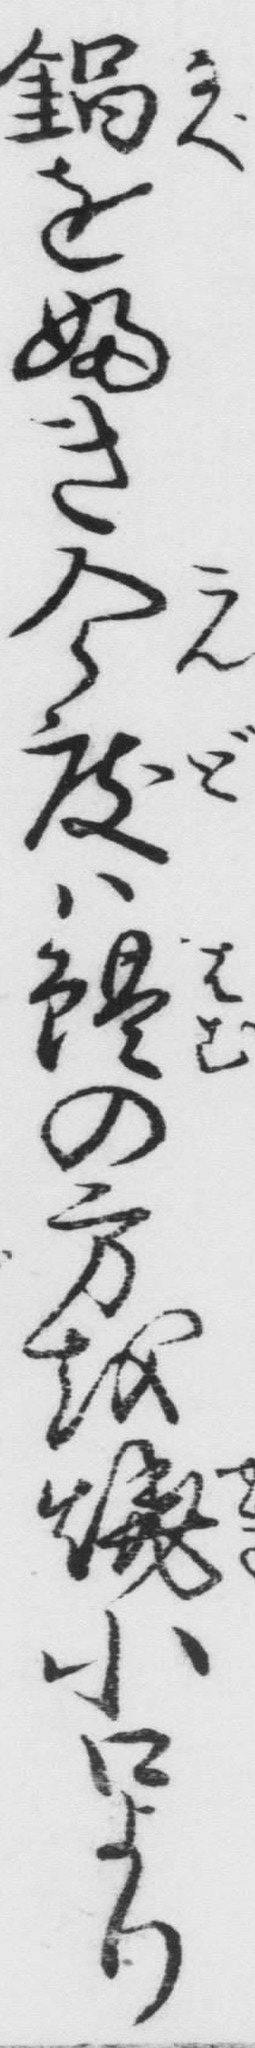鍋をふき今度は鱧の方を焼小口より
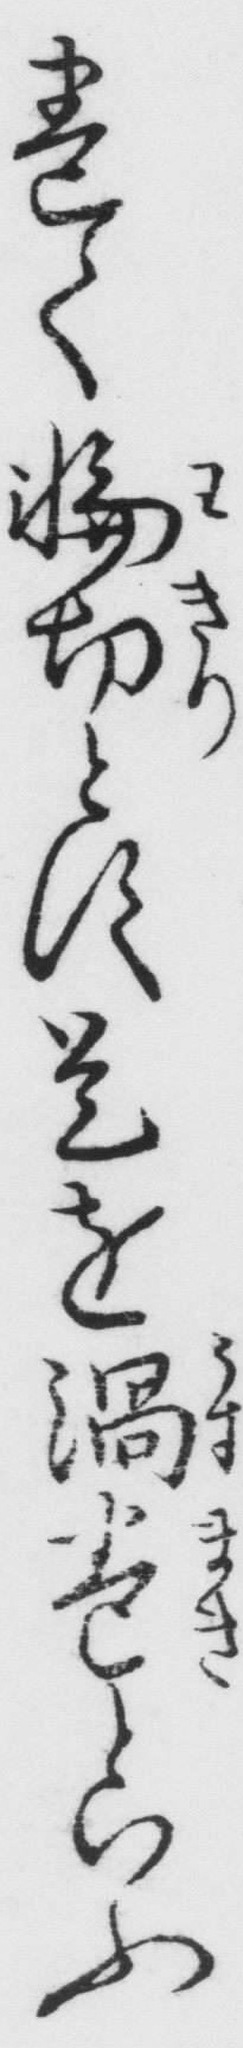巻て輪切とす是を渦巻といふ
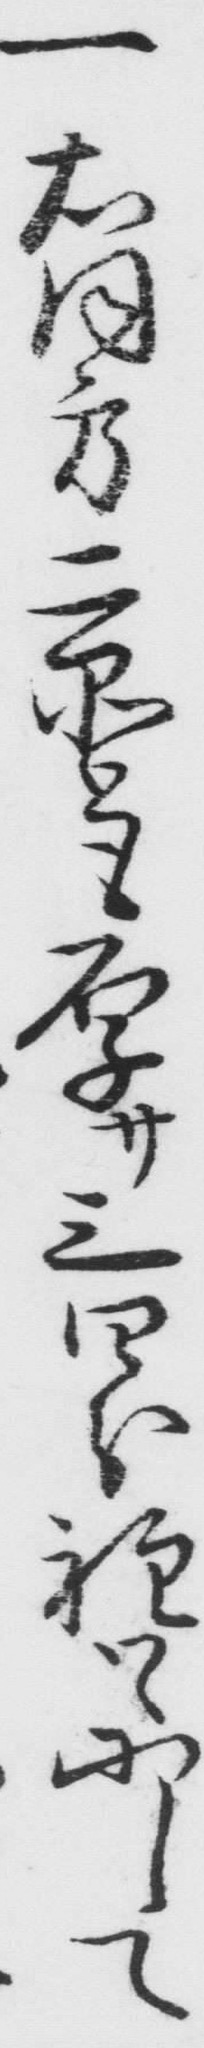一右同方二品とも厚さ三四分程つゝにして
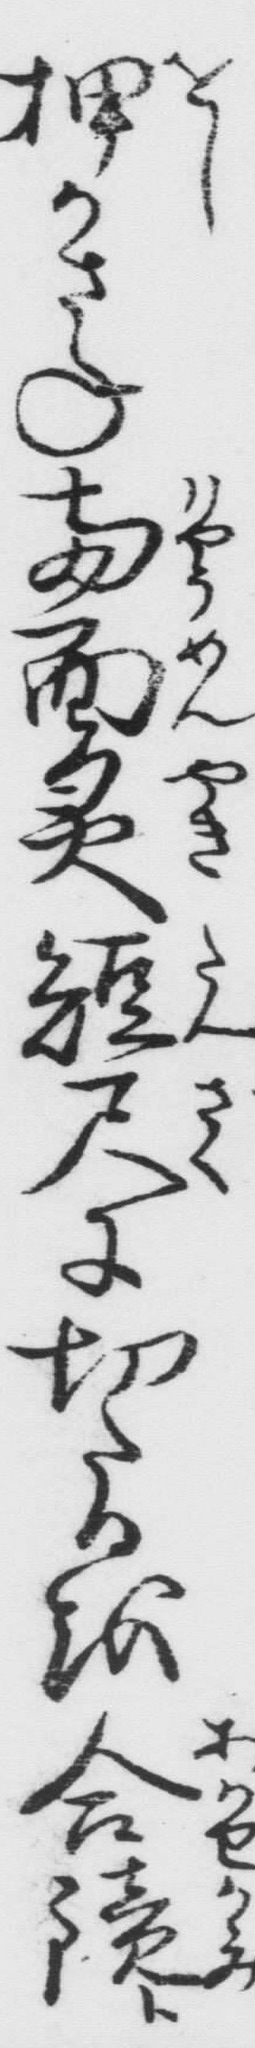押かさね両面炙短尺に切たるを合鏡と
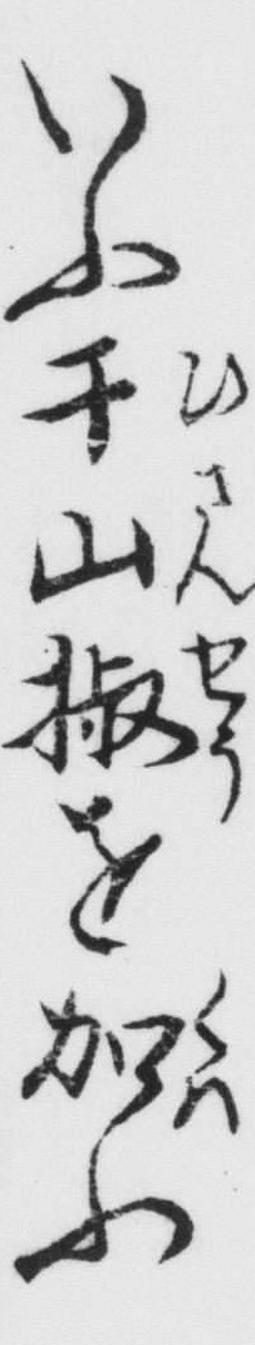いふ干山椒を加ふ
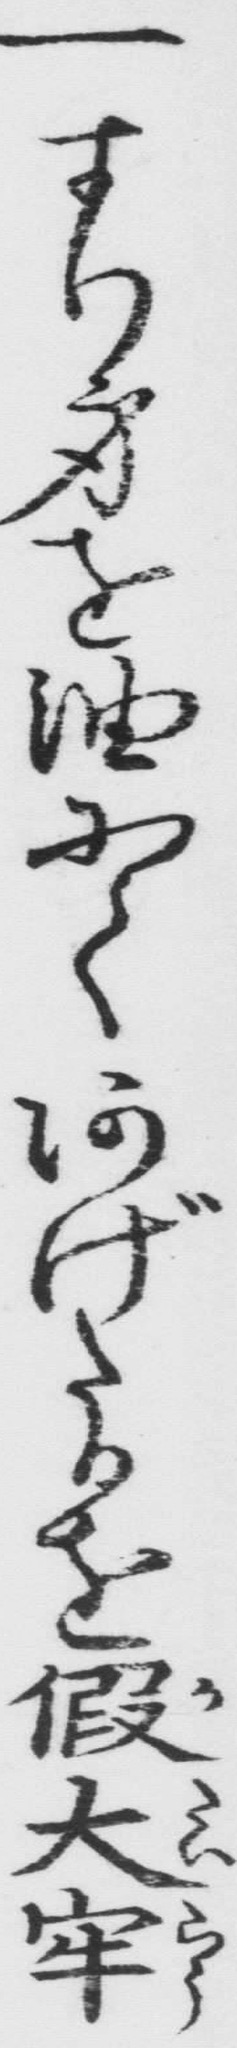一すり身を油にてあげたるを仮大牢
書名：海鰻百珍
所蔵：大阪府立大学学術情報センター 国文学研究資料館
